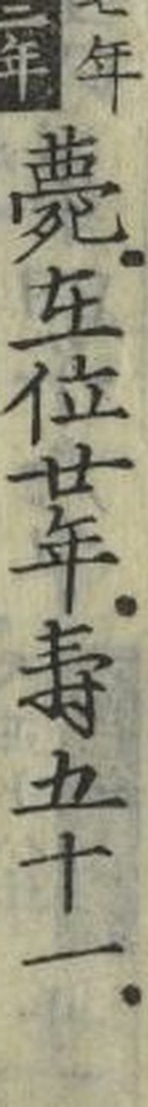薨・在位廿一年・寿四十一
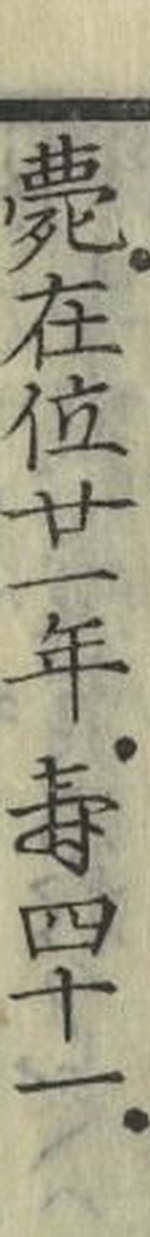薨・在位廿一年・寿四十一
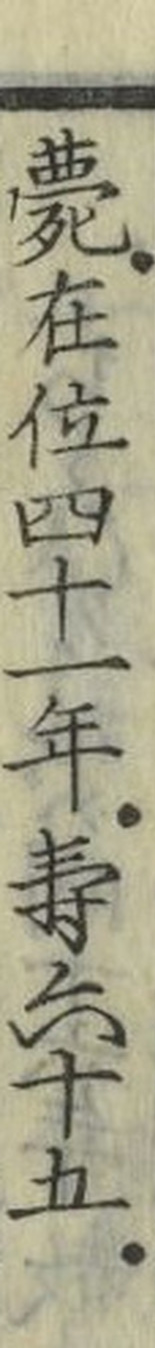薨・在位四十一年・寿六十五
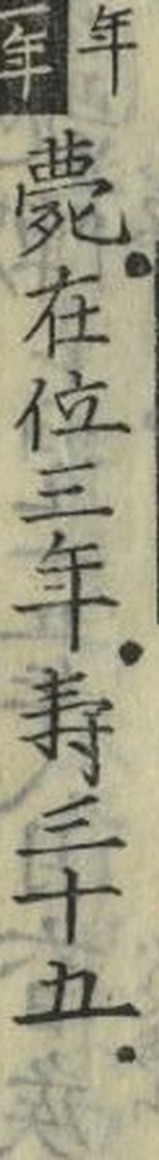薨・在位四十一年・寿六十五

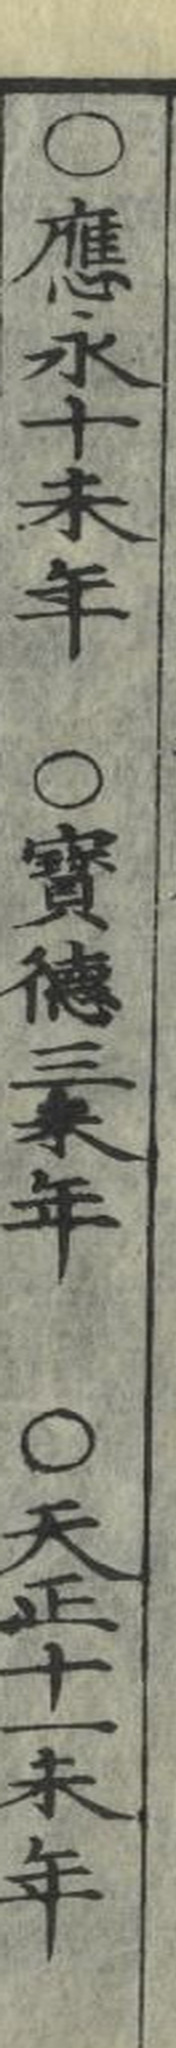〇應水十未年〇寶德三未年〇天正十一未年
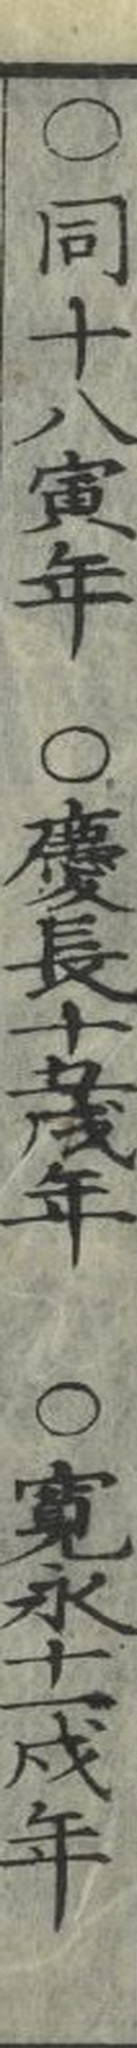〇同十八寅年〇慶長十五戌年〇寛永十一戌年
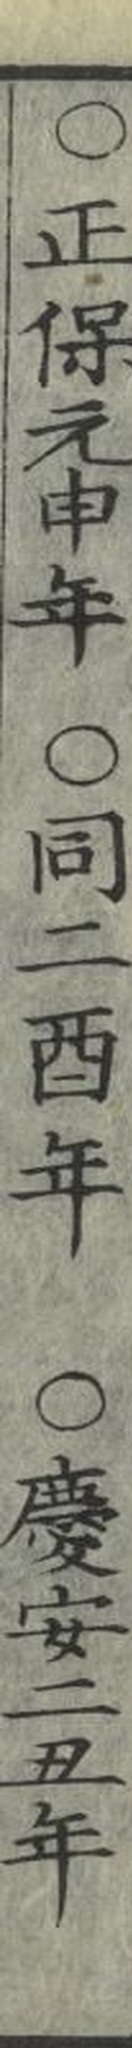〇正保元申年〇同二酉年〇慶安二丑年
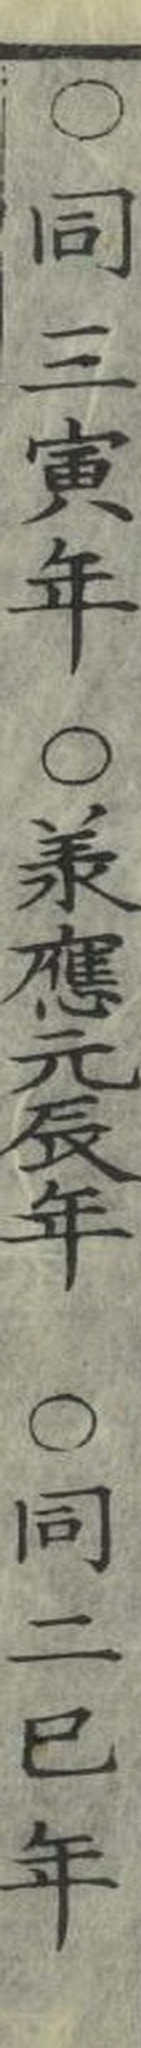〇同三寅年〇應元辰年〇同二巳年
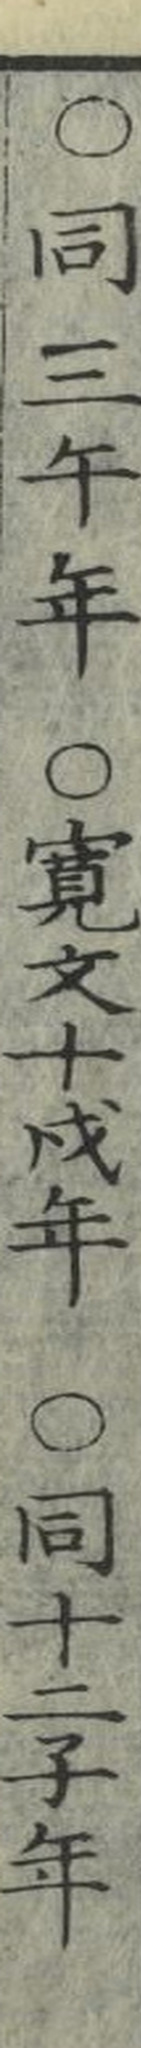〇同三午年〇寬文十戌年〇同十二子年
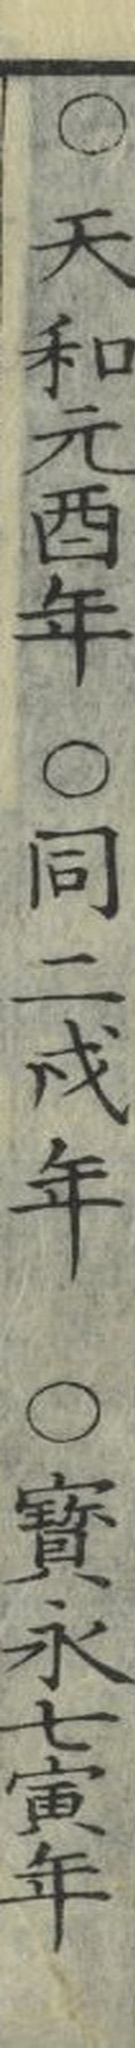〇天和元酉年〇同二戌年〇寛永七寅年
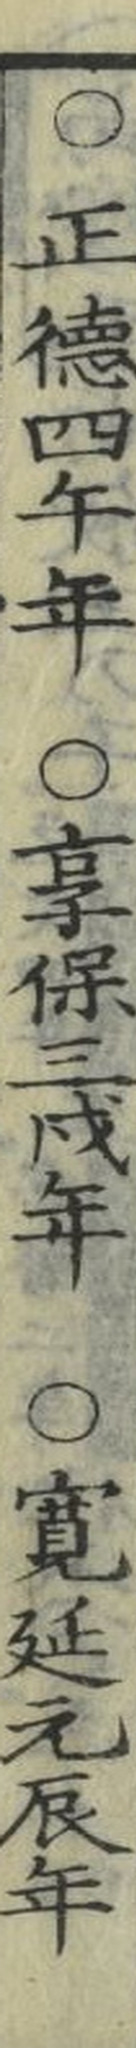〇正德四午年〇享保三戌年〇寬延元辰年
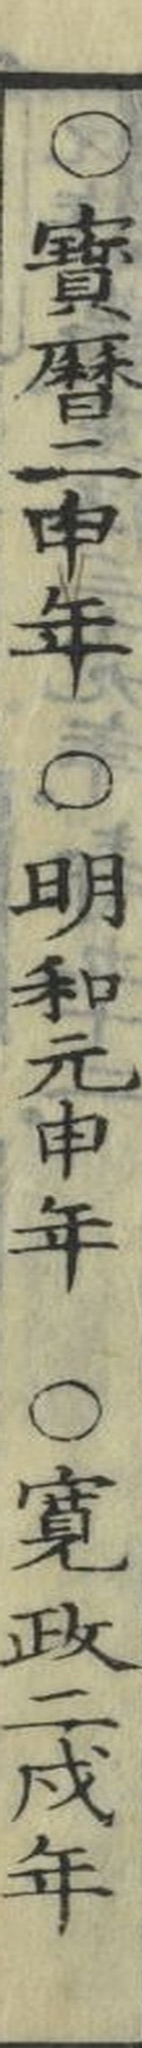〇寶曆二申年〇明和元申年〇寬政二戌年
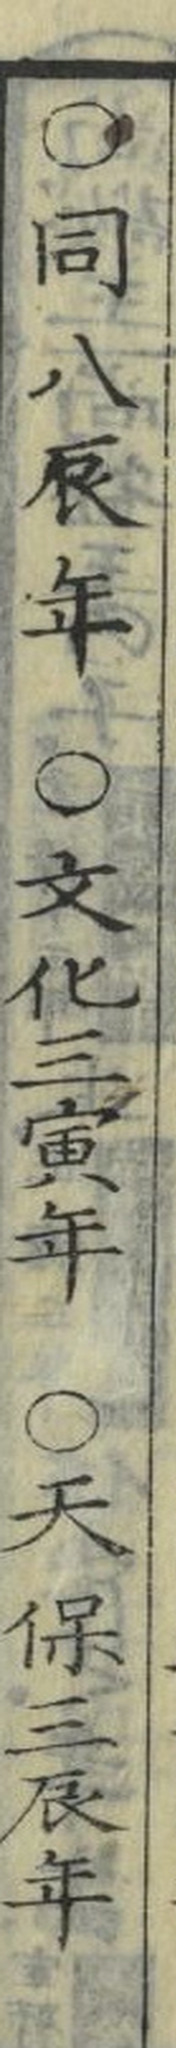〇同八辰年〇文化三寅年〇天保三辰年
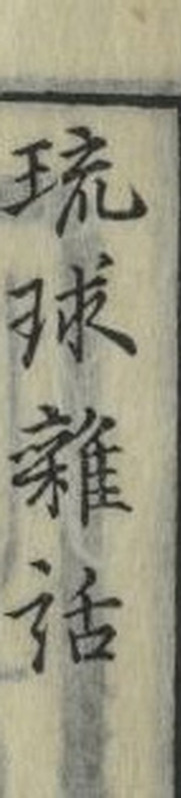琉球雜話
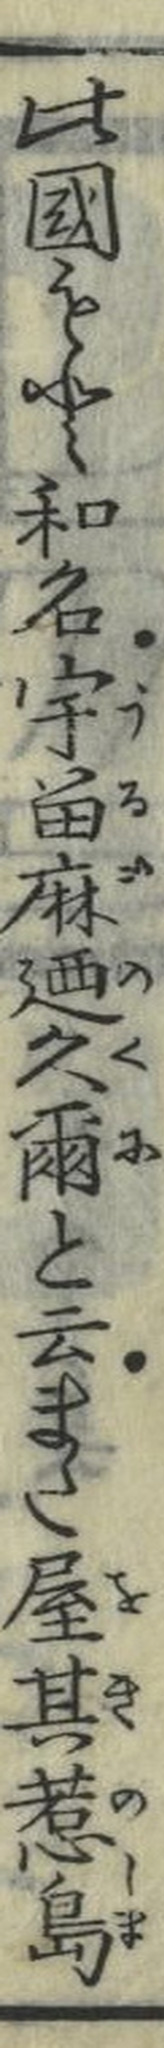此國もと和名・宇留麻府迺久爾と云・また屋其惹島
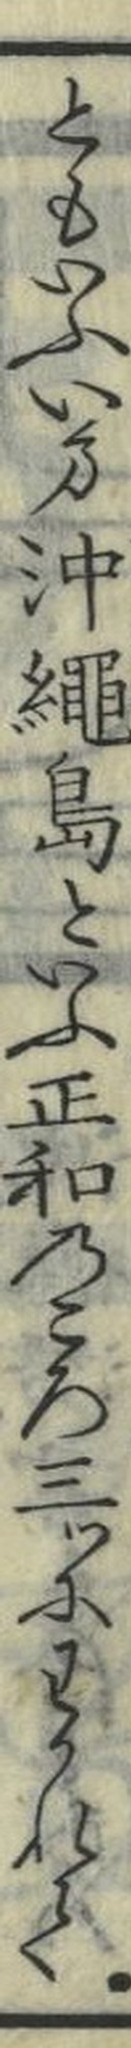ともいふ・いま沖繩島といふ・正和のころ・三つにわかれて・
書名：琉球秊代記 附雑話 全
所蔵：University of the Ryukyus Library
